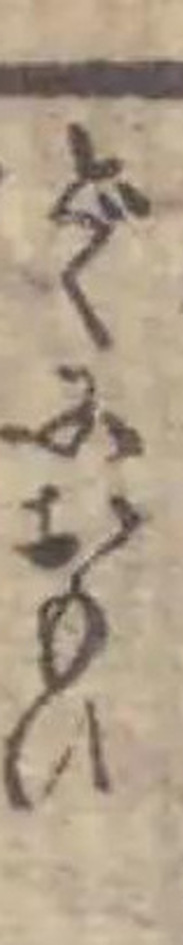どくにおもい
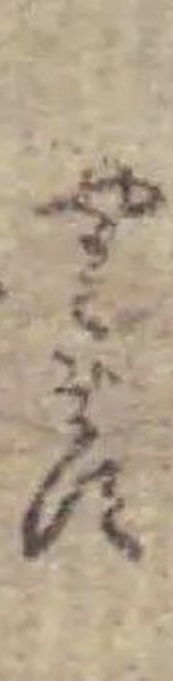やみます
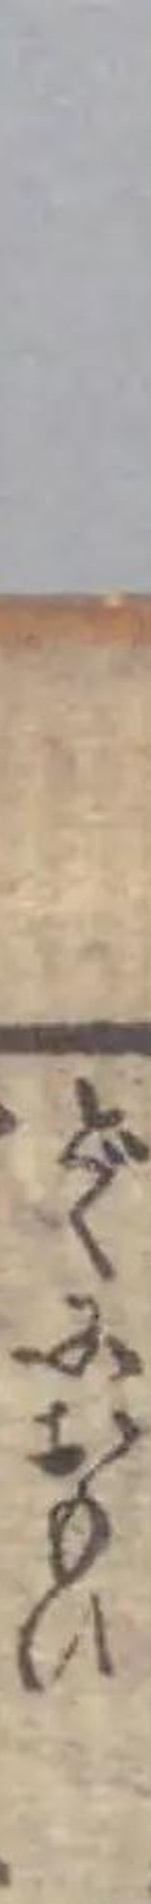どくにおもい
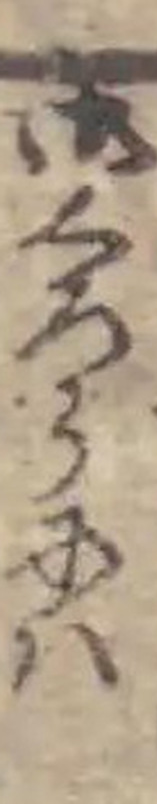御くろうには
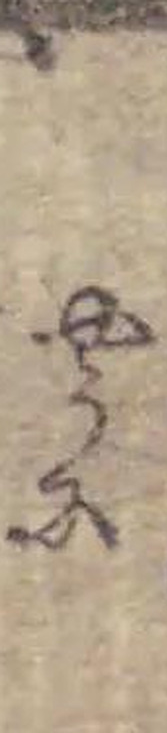やうに
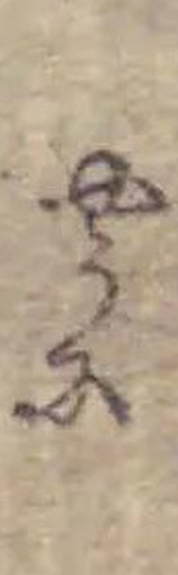やうに
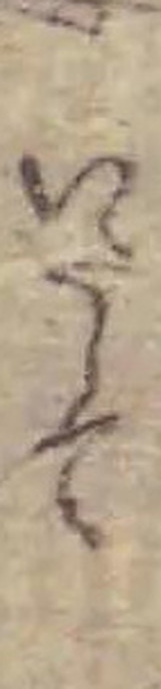いたして
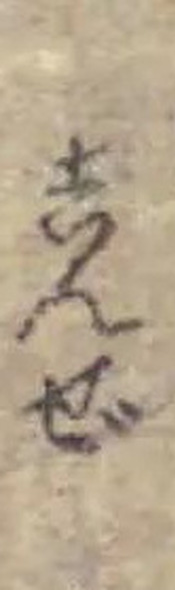しんぜ
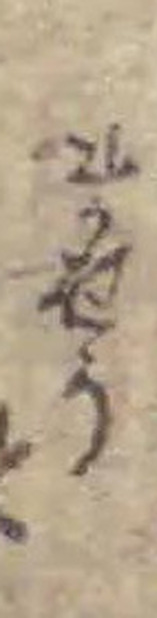ませうと
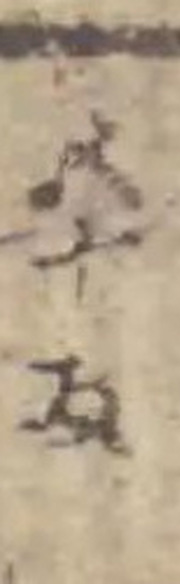五十両
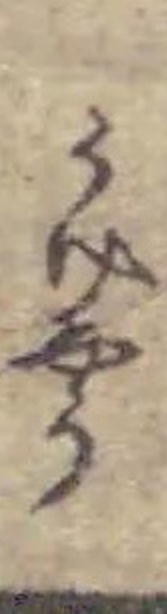うけやう
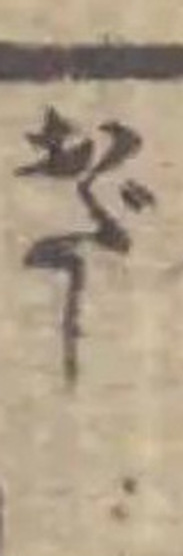おだし
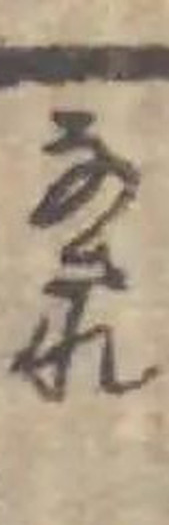なされ
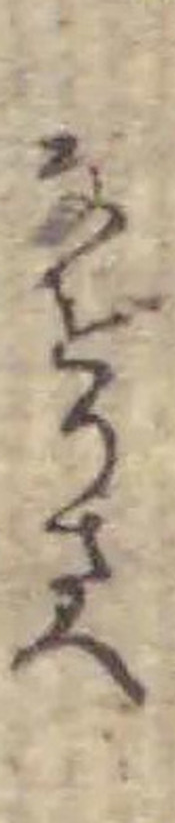なをりさへ
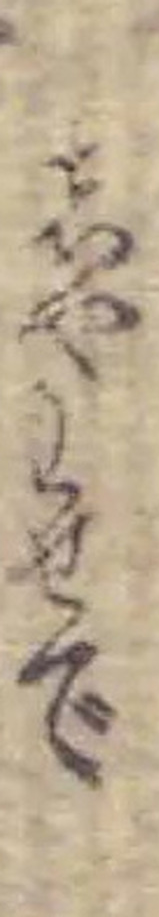しやわせで

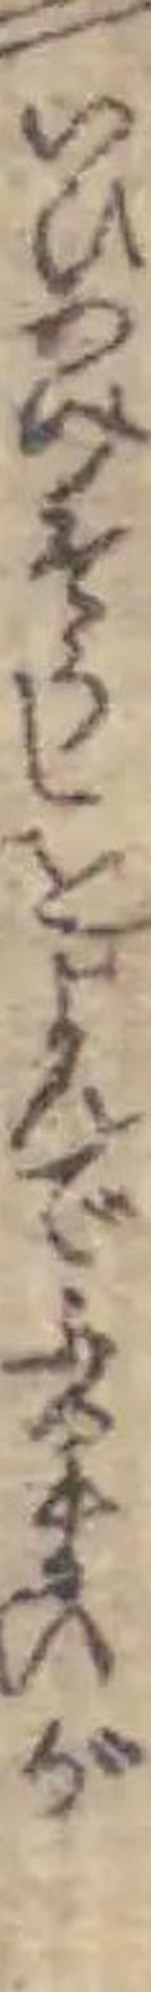いひつけそうしをよんでふるまいが
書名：飲中八人前 3巻
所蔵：国立国会図書館 National Diet Library, JAPAN
